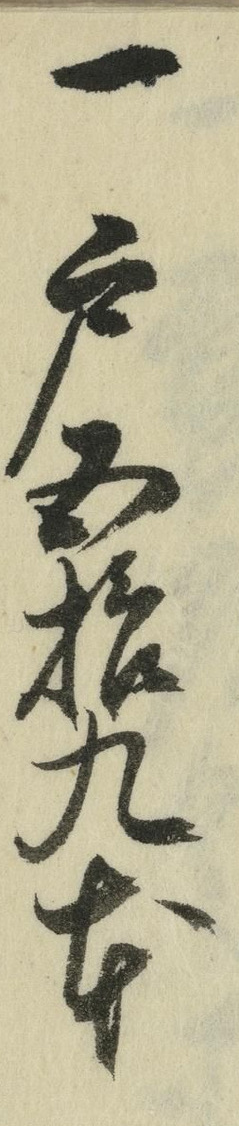一戸五拾九本
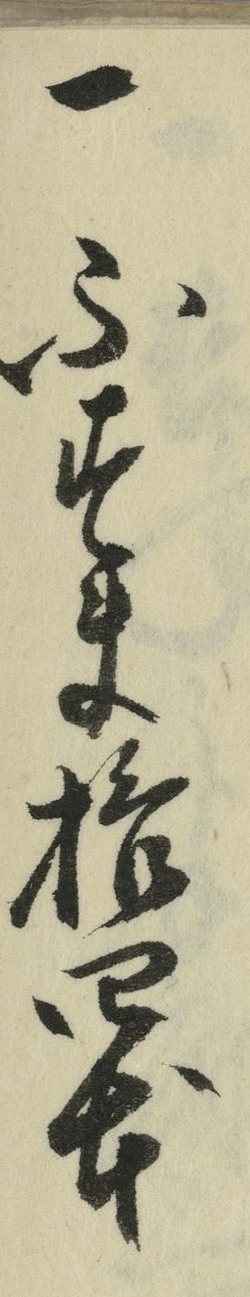一ふすま拾四本
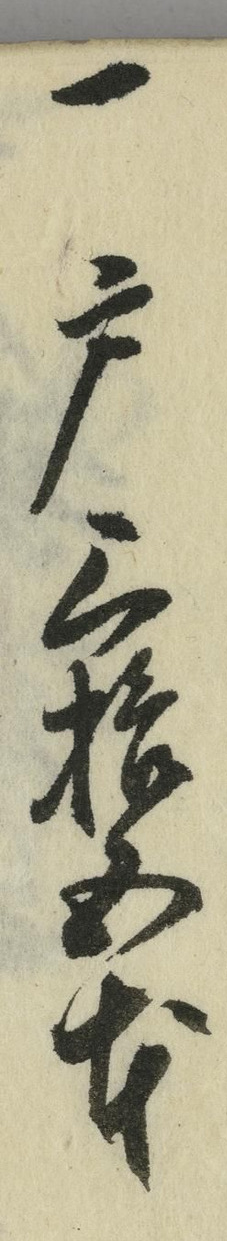一戸五拾九本
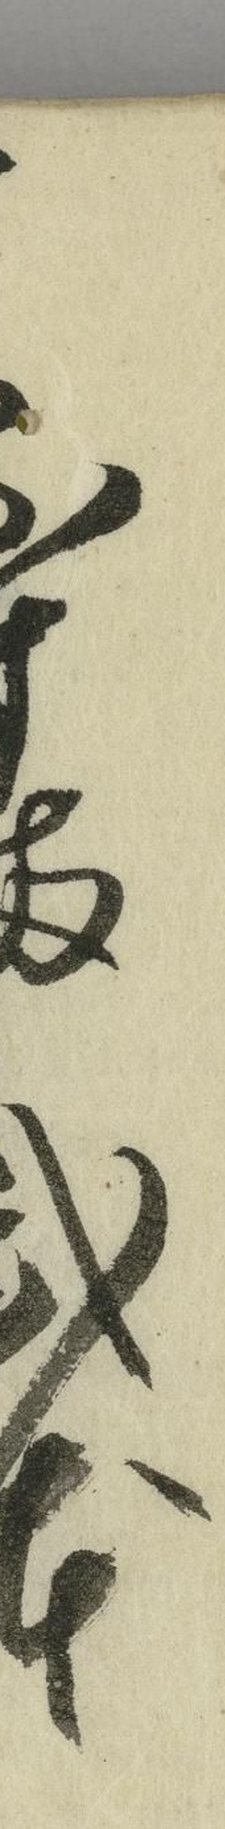一ふすま拾四本

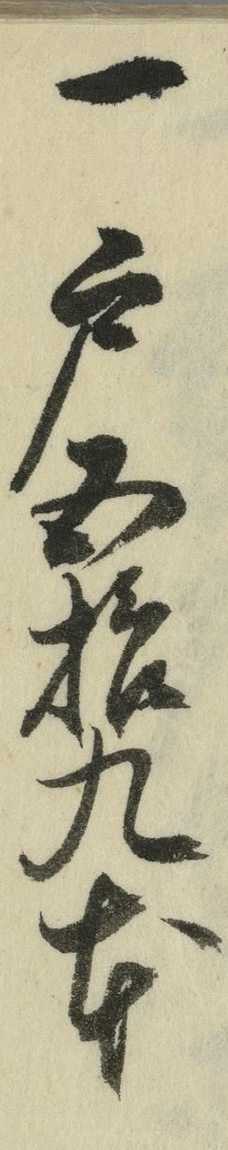一戸三拾五本
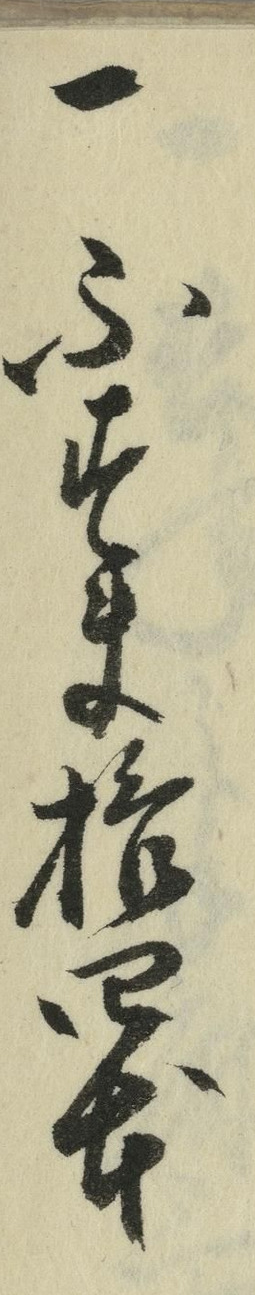一ふすま弐本
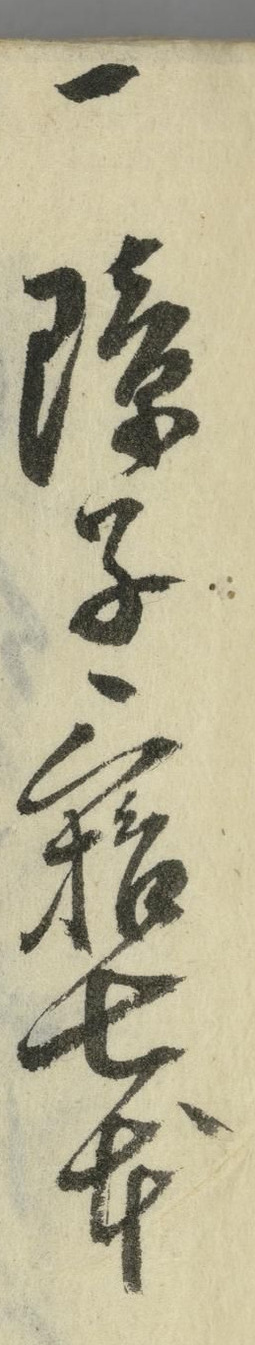一障子三拾七本
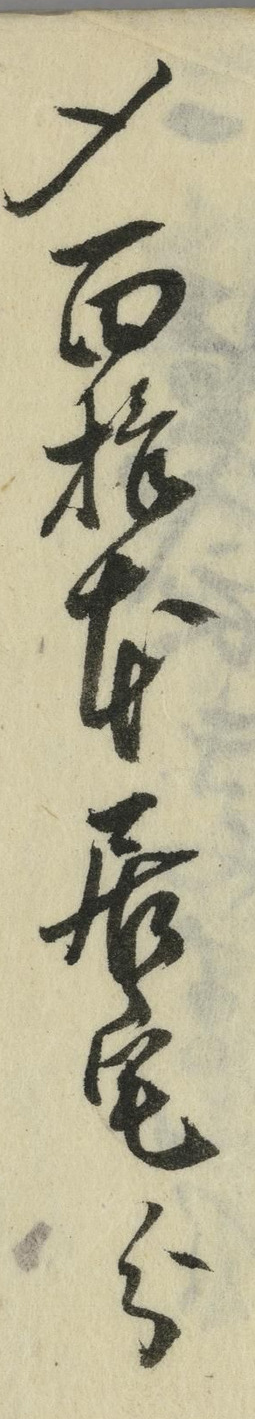〆百拾本居宅分
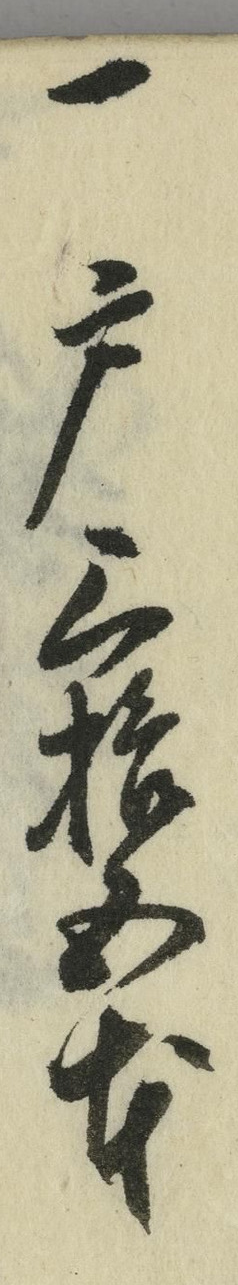一戸三拾五本
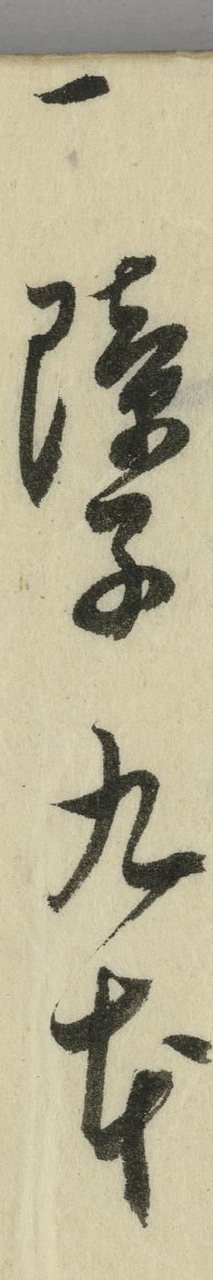一障子九本
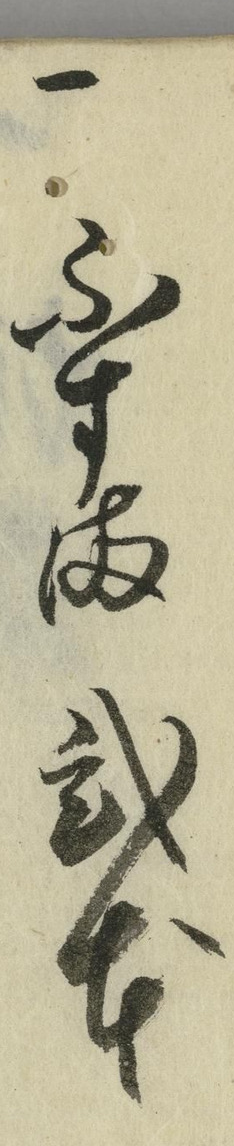一ふすま弐本
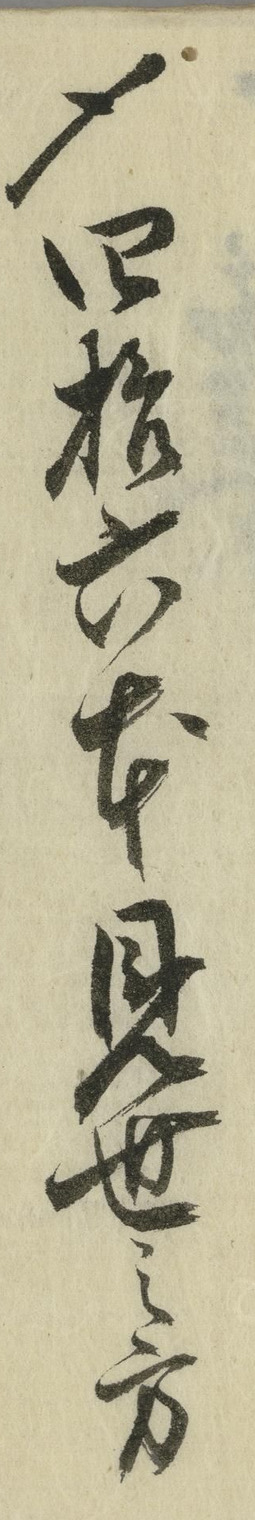〆四拾六本見世之分
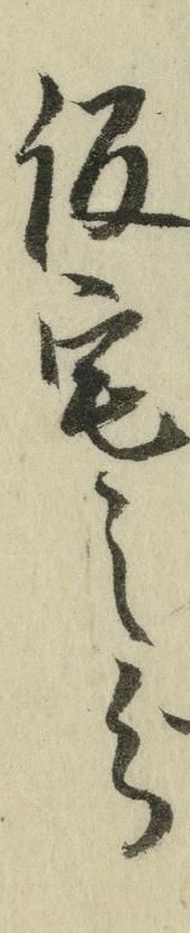仮宅之分
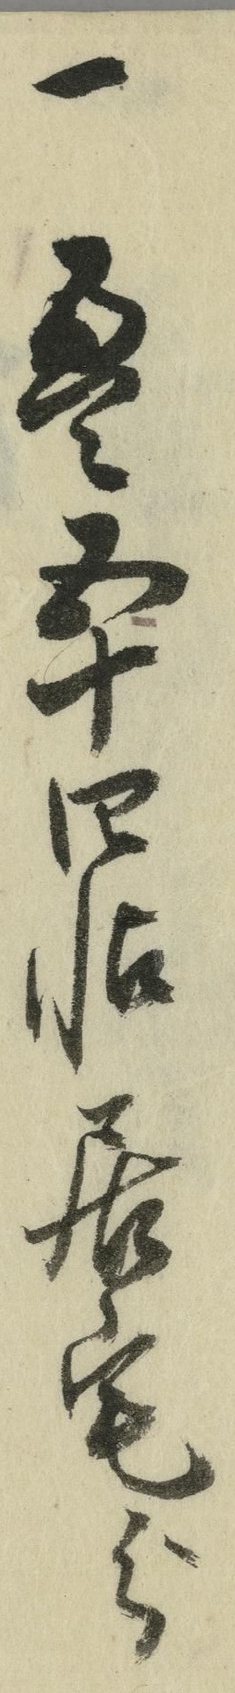一畳五十四帖居宅分
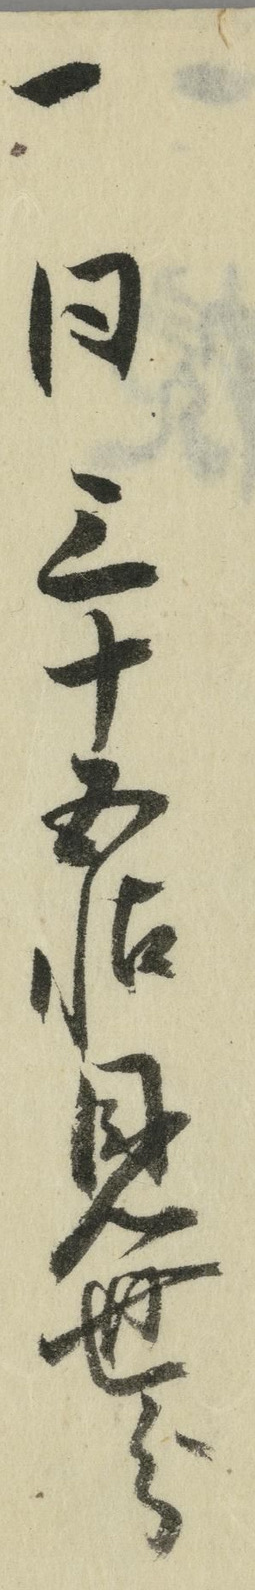一同三十五帖見世分
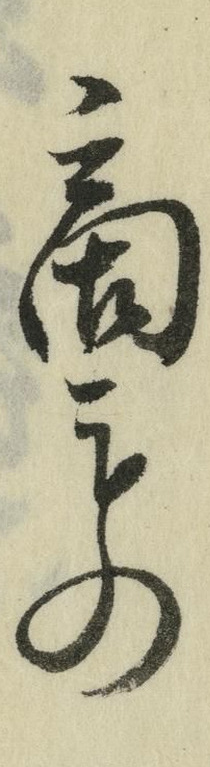商もの
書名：天明淺間噴火ニ関スル書類
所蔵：東京大学地震研究所図書室 Earthquake Research Institute Library, The University of Tokyo, JAPAN
